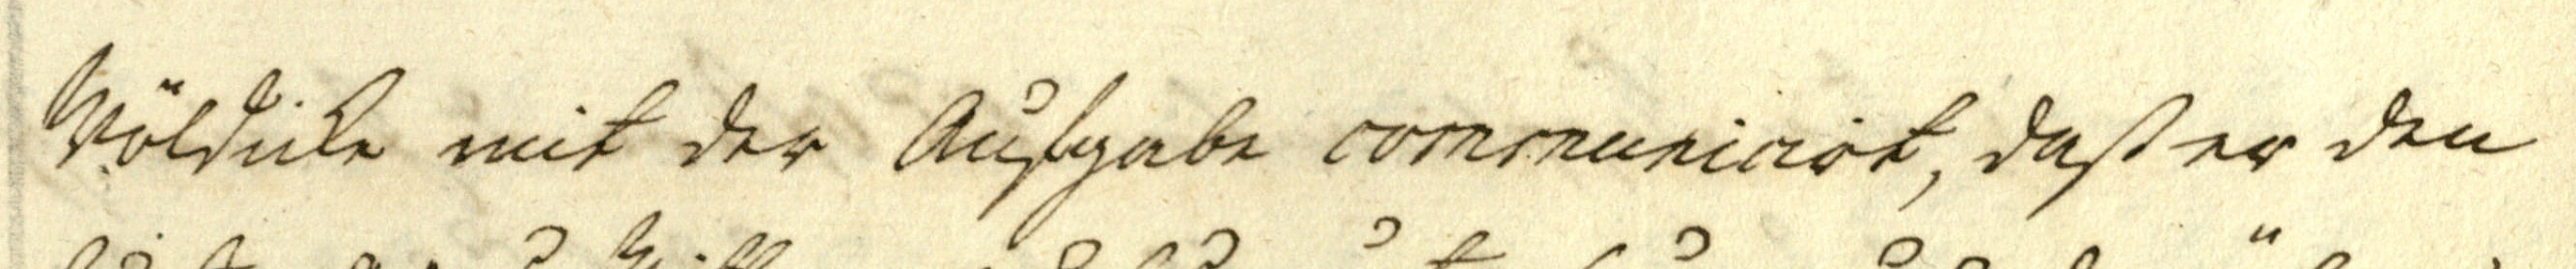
Wöldicke mit der Aufgabe communicirt, daß er den
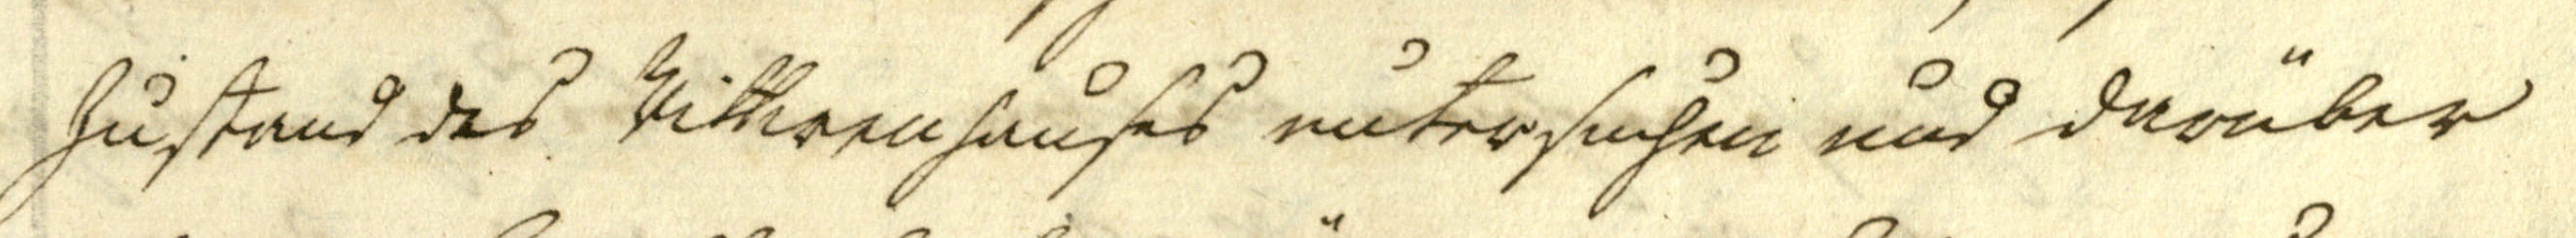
Zustand des Wittwenhauss untersuchen und darüber
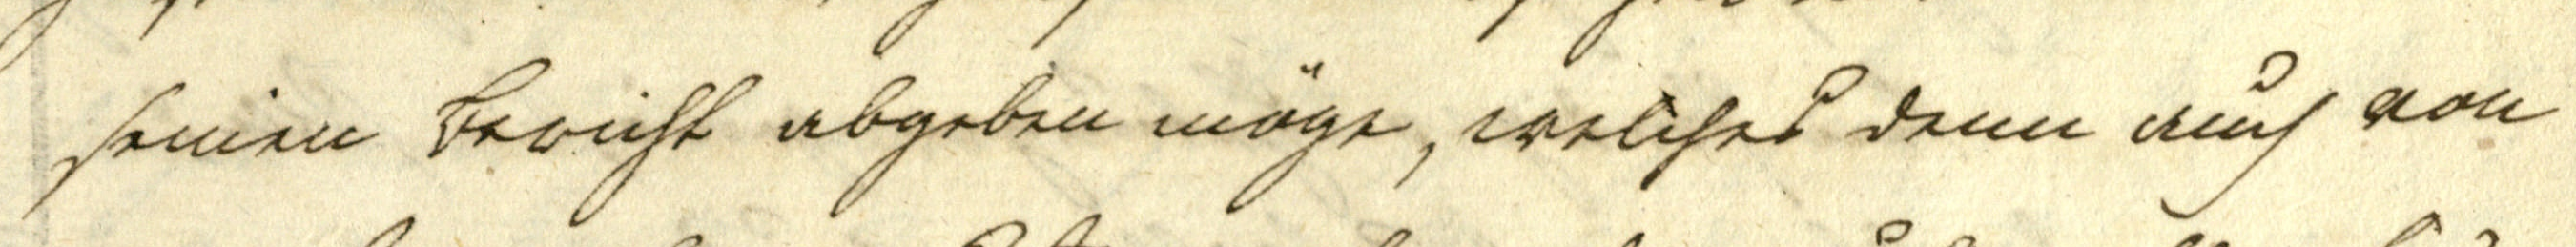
seinen Bericht abgeben möge, welches denn auch von
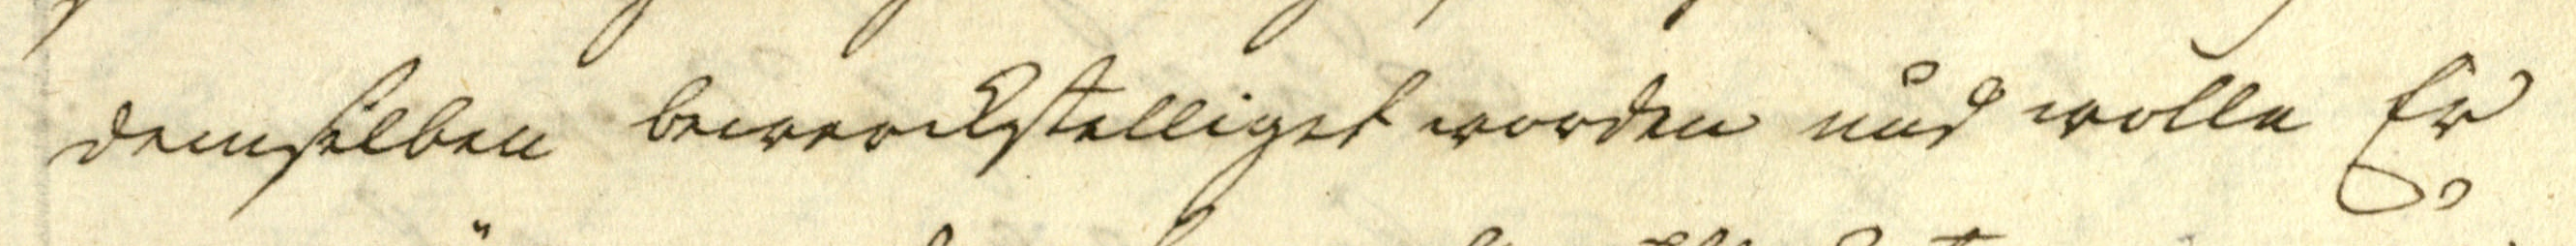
demselben bewerckstelliget worden und wolle Er
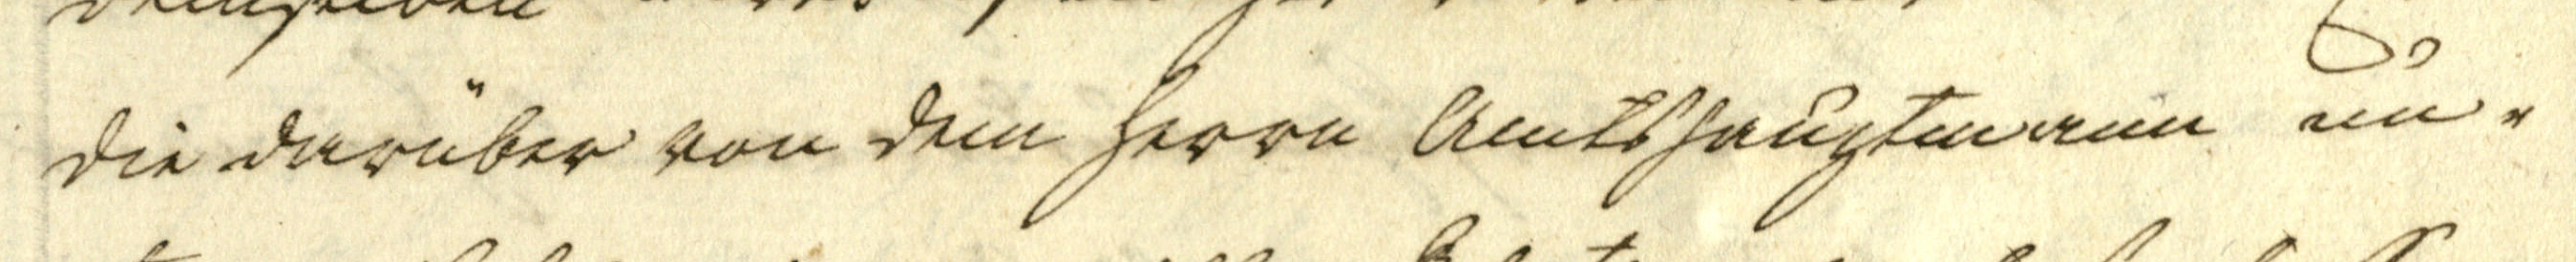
die darüber von dem Herrn Amtshauptmann un¬
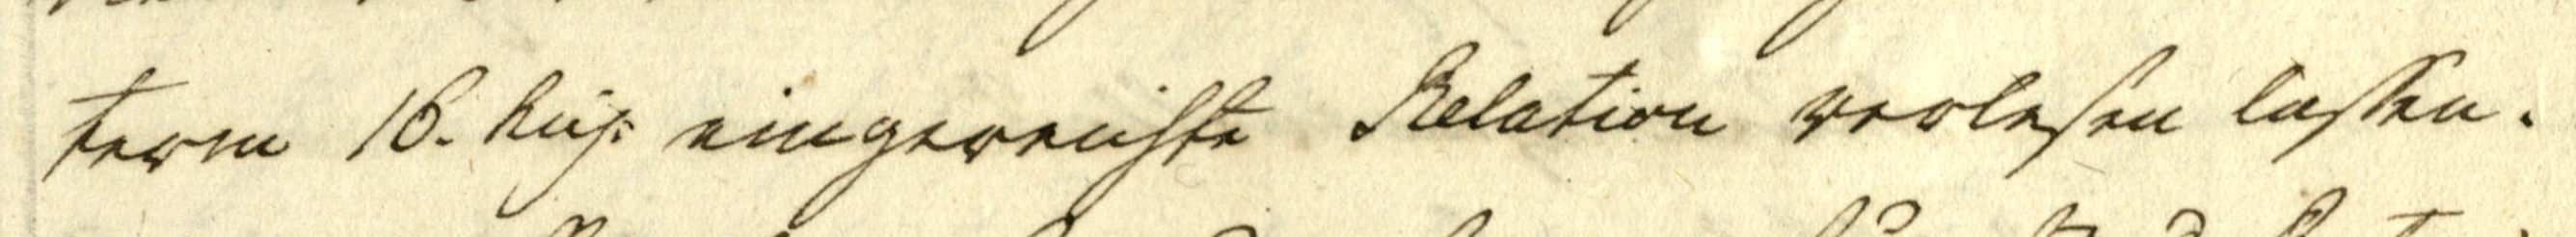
term 16. huj. eingereichte Relation verlesen lassen.
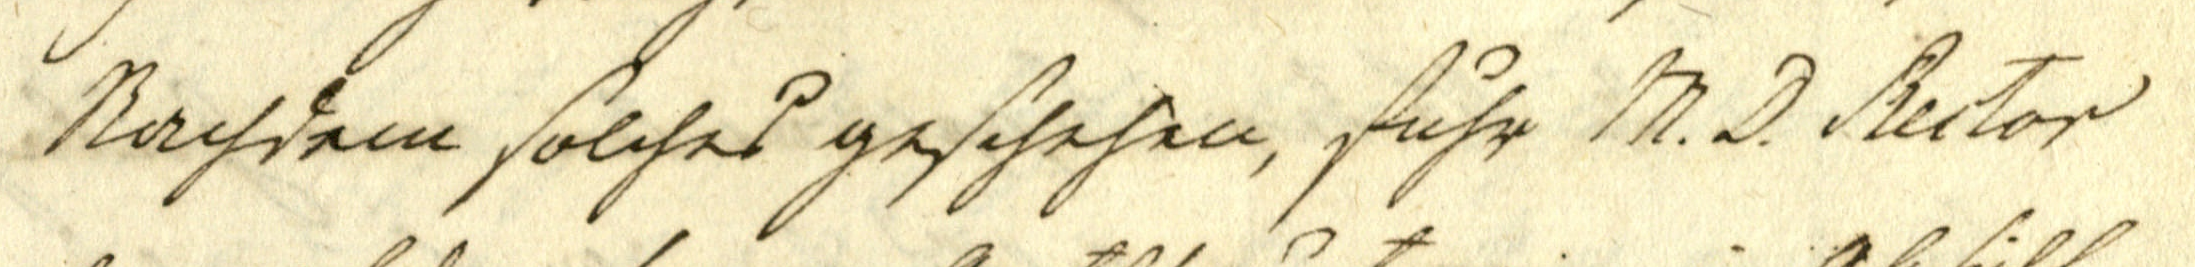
Nachdem solches geschehen, fuhr M. D Rector
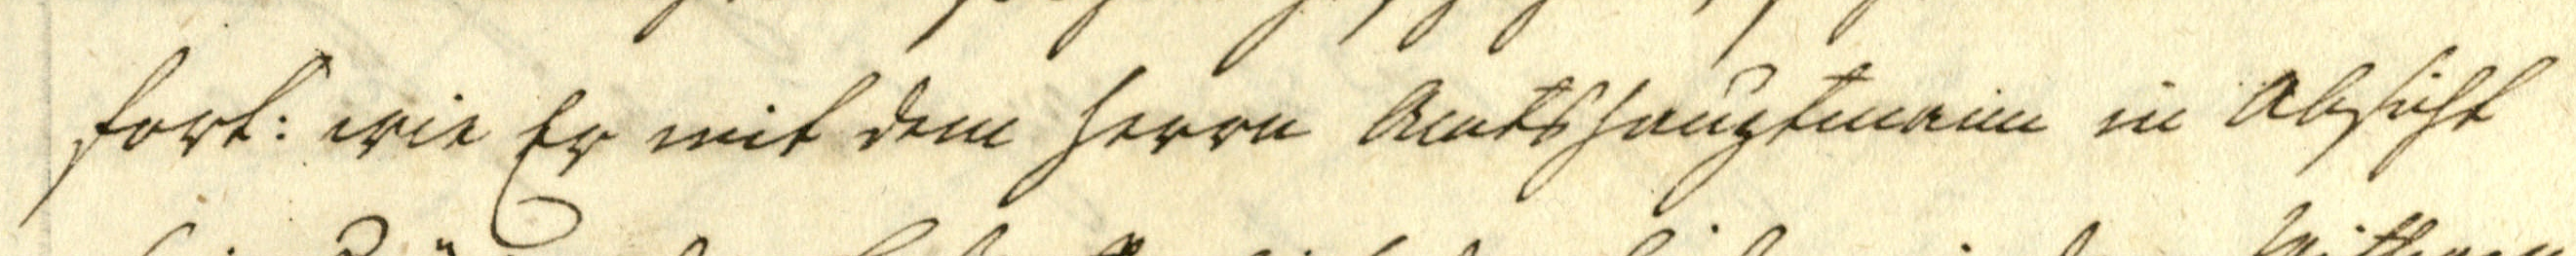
fort: wie Er mit dem Herrn Amtshauptmann in Absicht
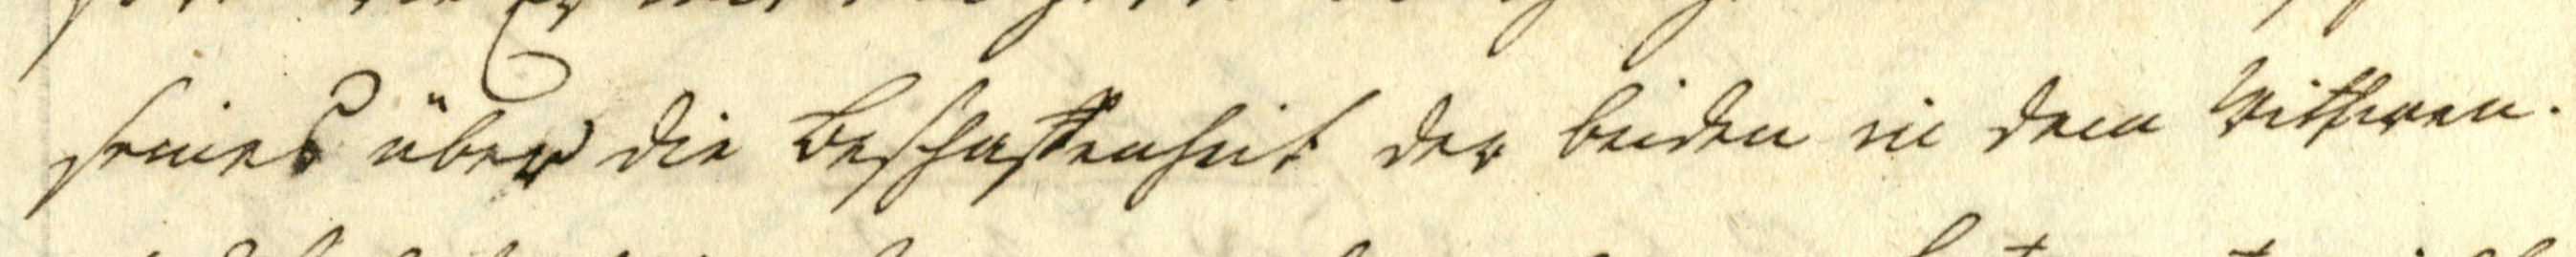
seines über die Beschaffenheit der beiden in dem Wittwen¬
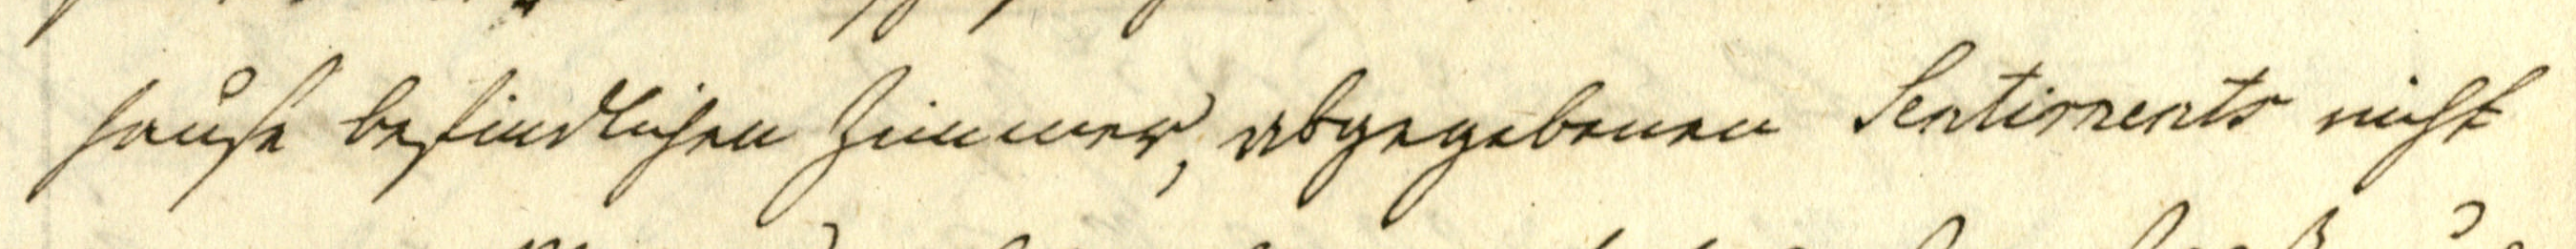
hause befindlichen Zimmer, abgegebenen Sentiments nicht
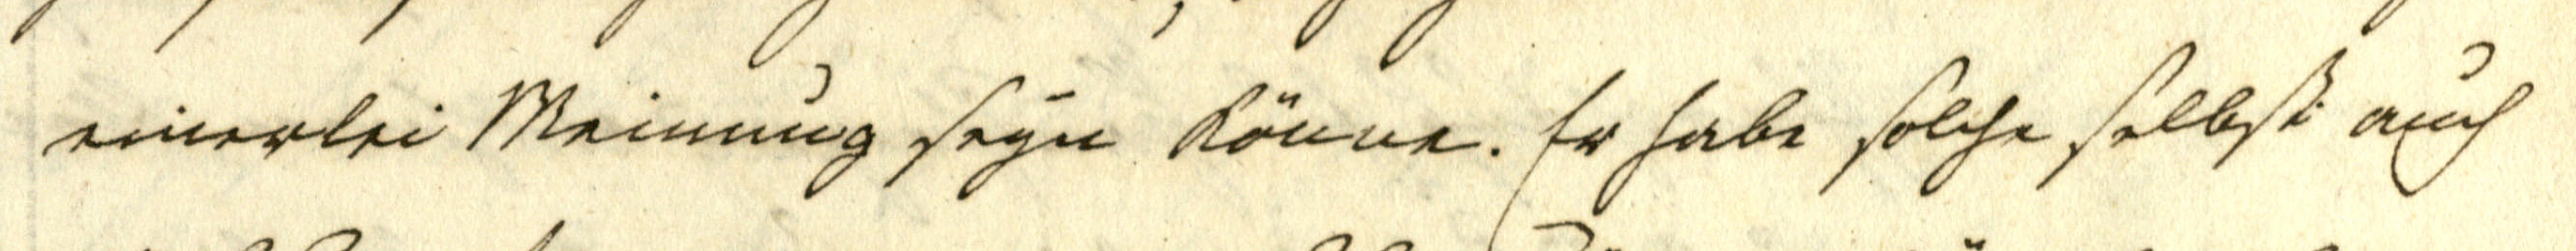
einerlei Meinung seÿn könne. Er habe solche selbst auch
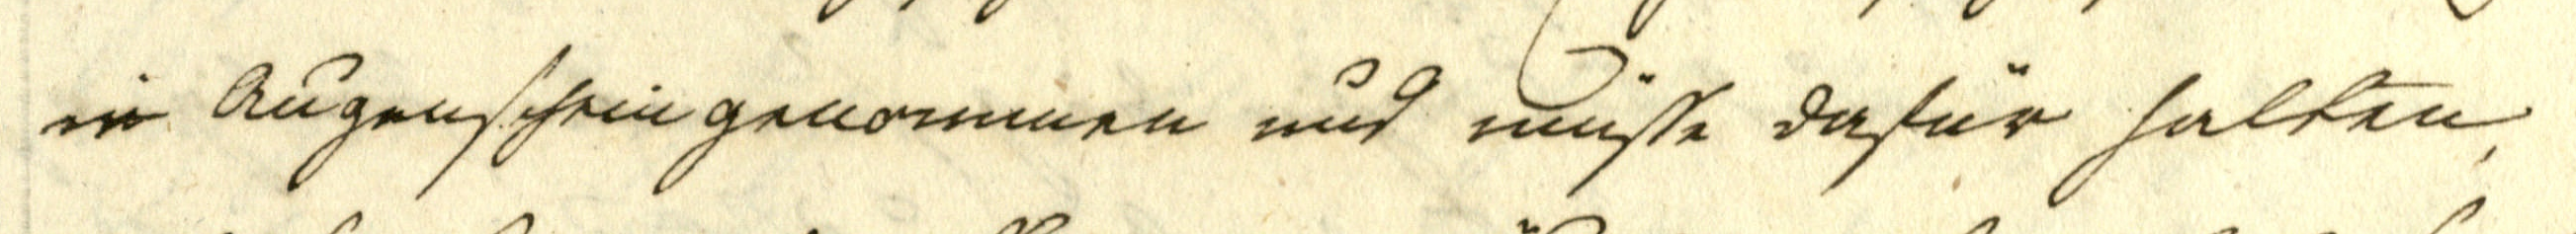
in Augenschein genommen und müsse dafür halten,
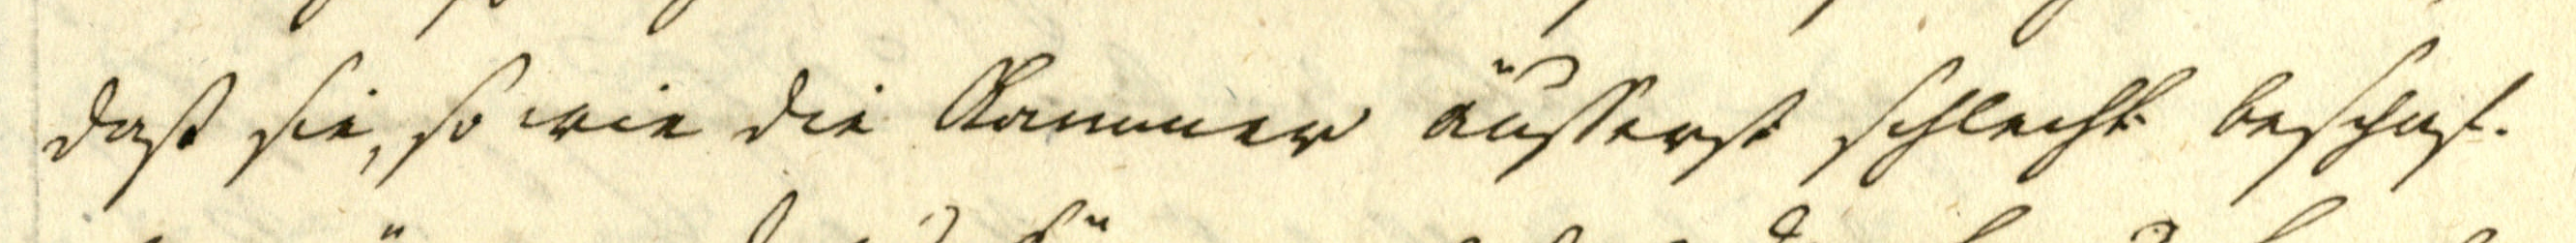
daß sie, so wie die Kammer äusserst schlecht beschaf¬
